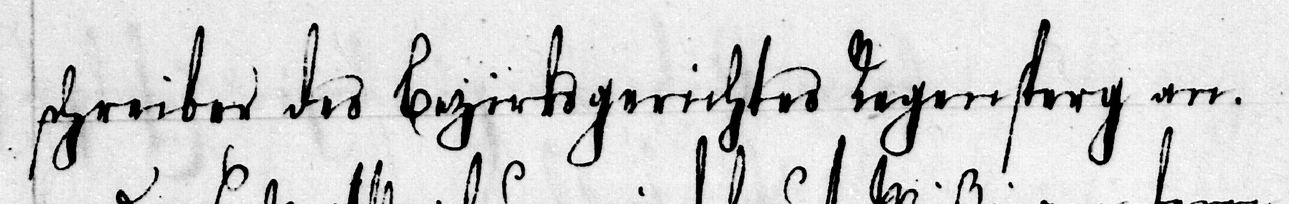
schreiber des Bezirksgerichtes Regensperg an.
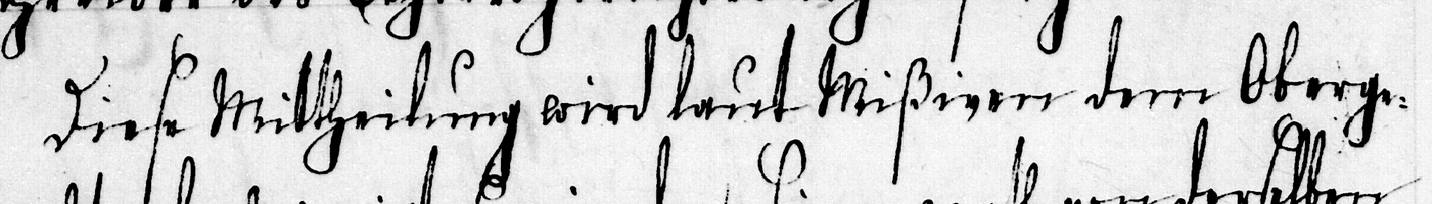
Diese Mittheilung wird laut Mißiven dem Oberge¬
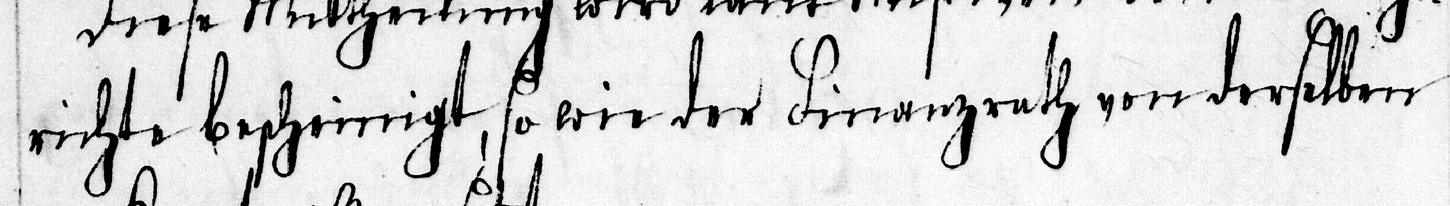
richte bescheinigt, so wie der Finanzrath von derselben
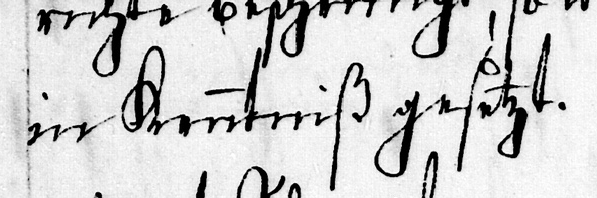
in Kenntniß gesetzt.
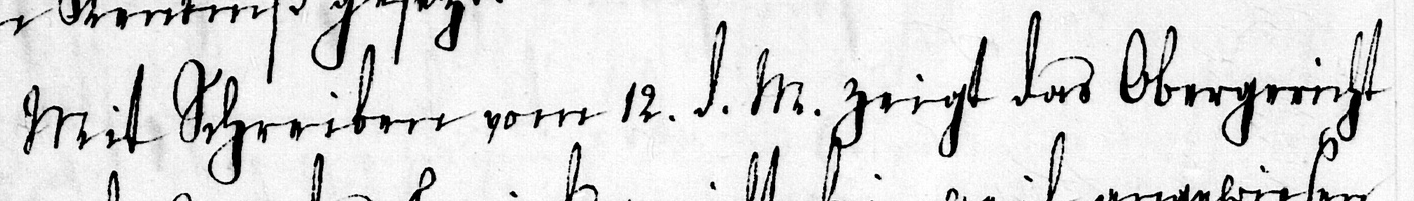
Mit Schreiben vom 12. d. M. zeigt das Obergericht
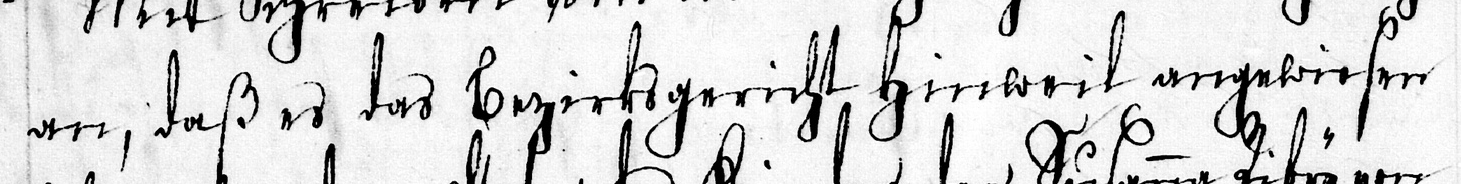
an, daß es das Bezirksgericht Hinweil angewiesen
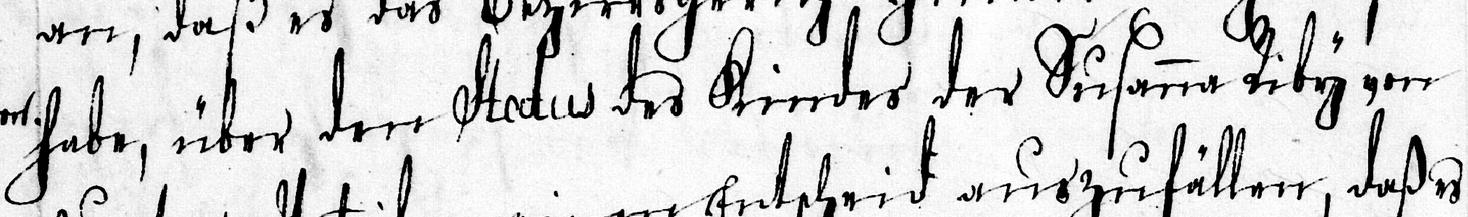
habe, über den Status des Kindes der Susanna Riby von
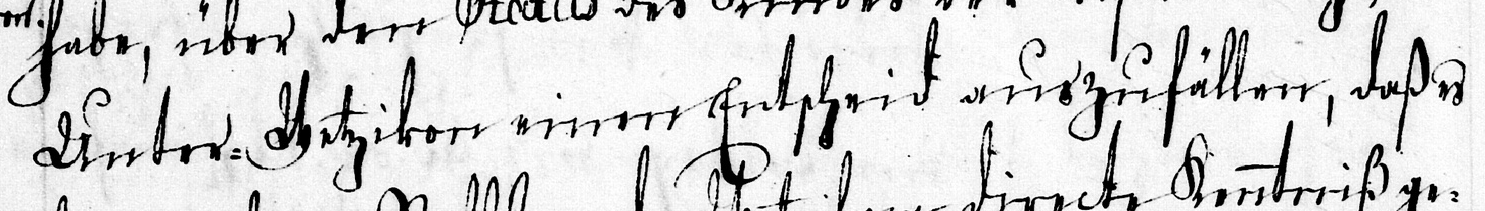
Unter-Wetzikon einen Entscheid auszufällen, daß es
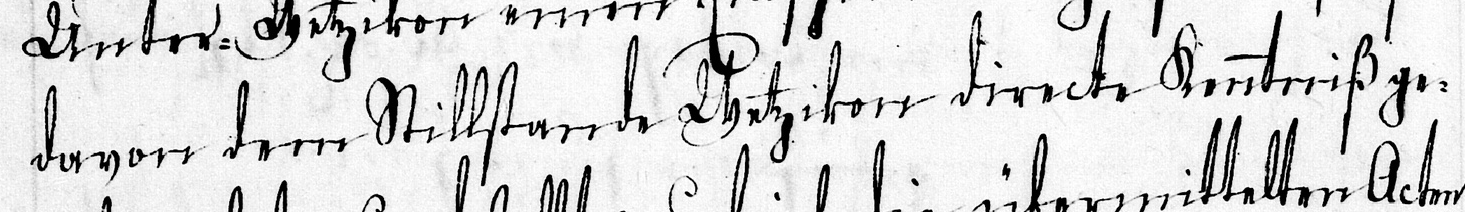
davon dem Stillstande Wetzikon directe Kenntniß ge¬
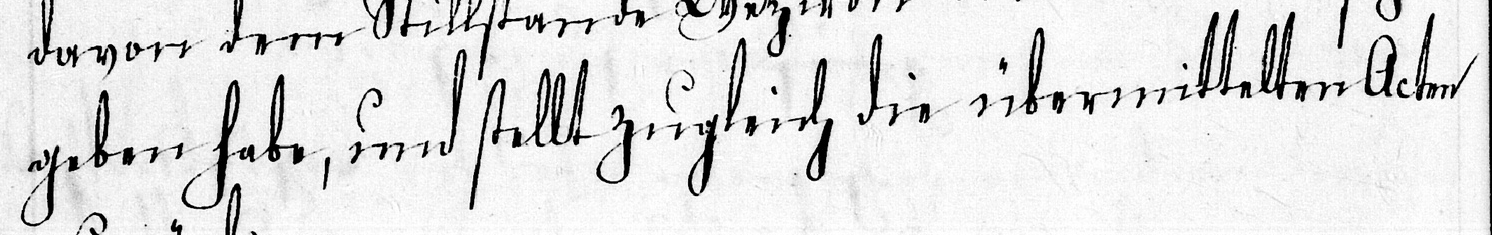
geben habe, und stellt zugleich die übermittelten Acten
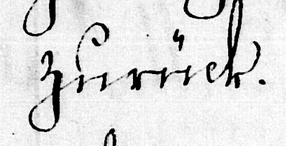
zurück.
